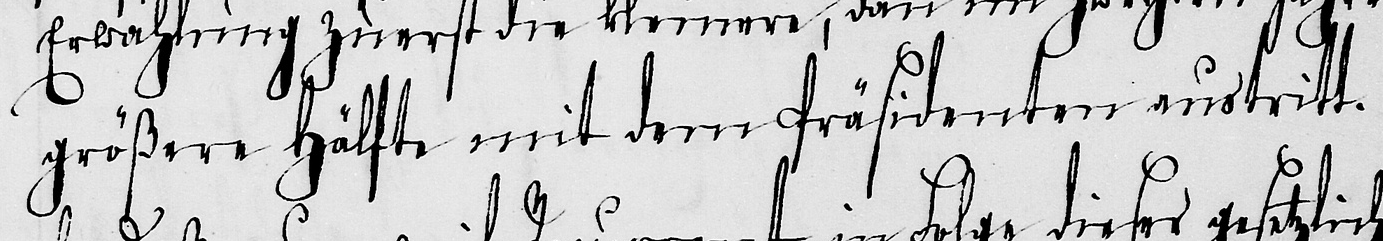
größere Hälfte mit dem Präsidenten austritt.
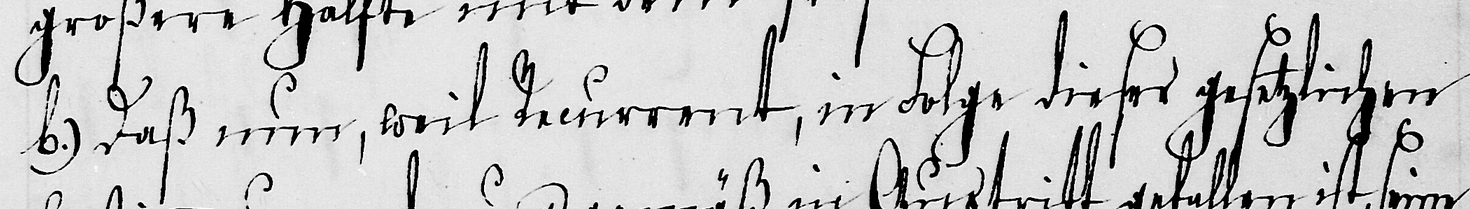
b.) Daß nun, weil Recurrent, in Folge dieser gesetzlichen
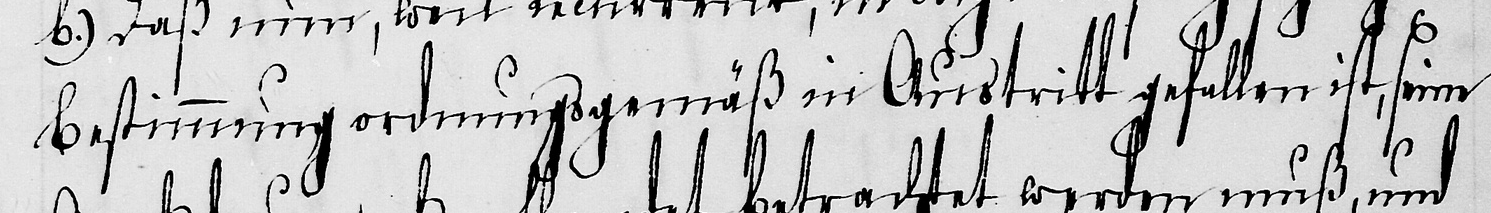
Bestimmung ordnungsgemäß in Austritt gefallen ist, sei¬
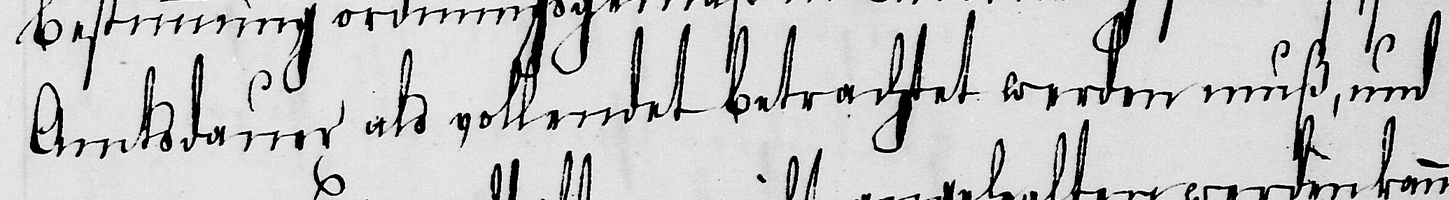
Amtsdauer als vollendet betrachtet werden muß, und
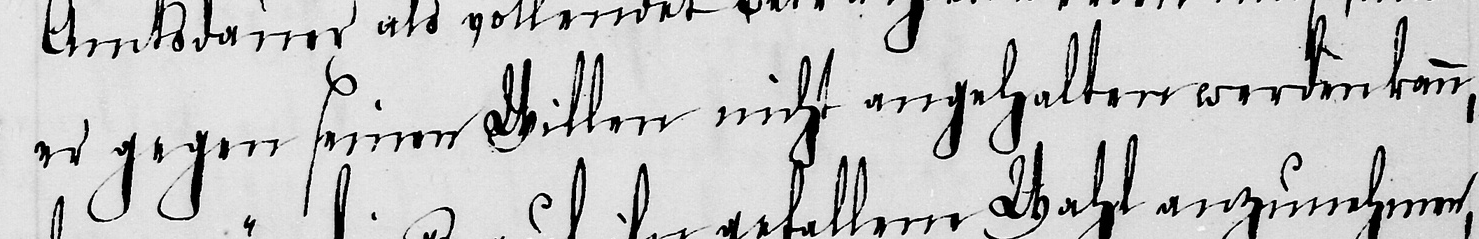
er gegen seinen Willen nicht angehalten werden kan¬
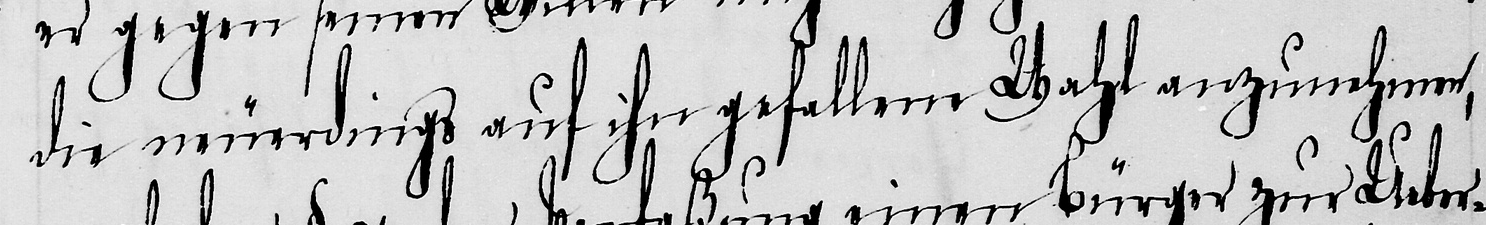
die neuerdings auf ihn gefallene Wahl anzunehmen,
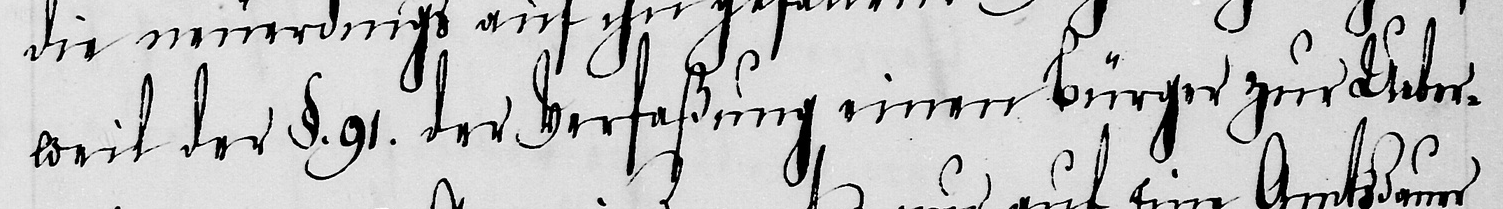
weil der §. 91. der Verfaßung einen Bürger zur Ueber¬
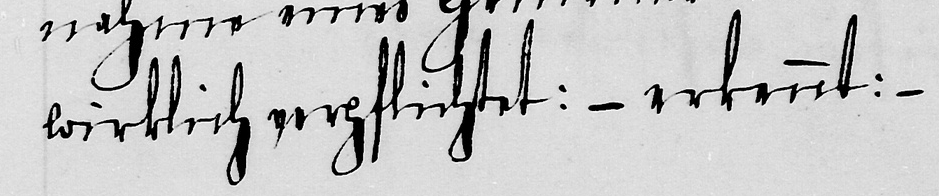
wirklich verpflichtet: – erkennt:
